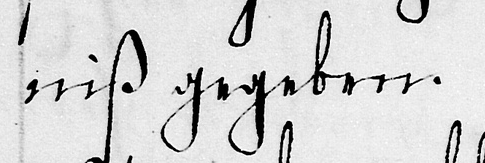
niß gegeben.
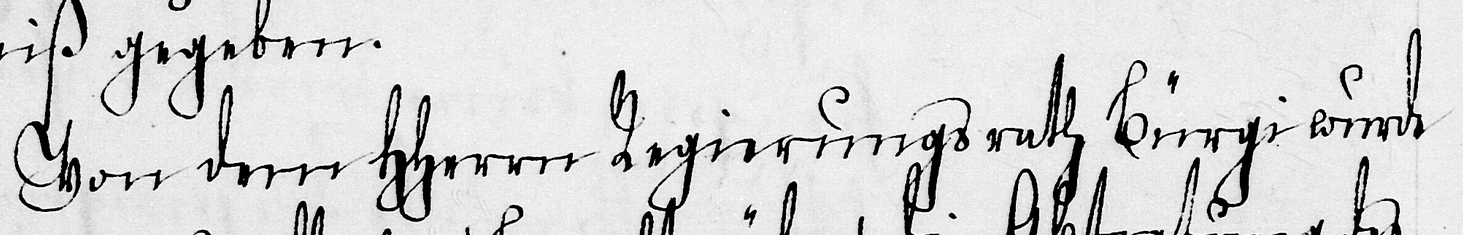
Von dem HHerrn Regierungsrath Bürgi wurde
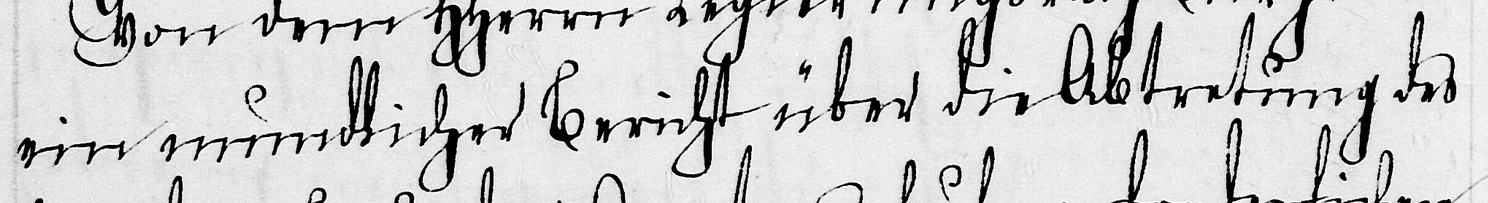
ein mundlicher Bericht über die Abtretung des
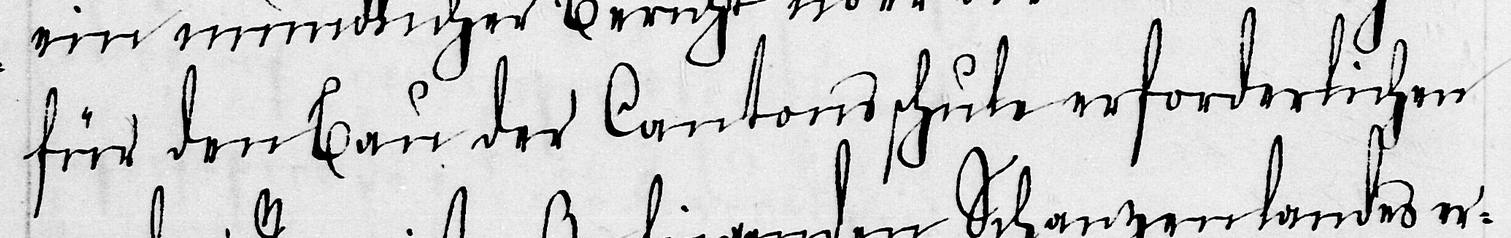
für den Bau der Cantonsschule erforderlichen
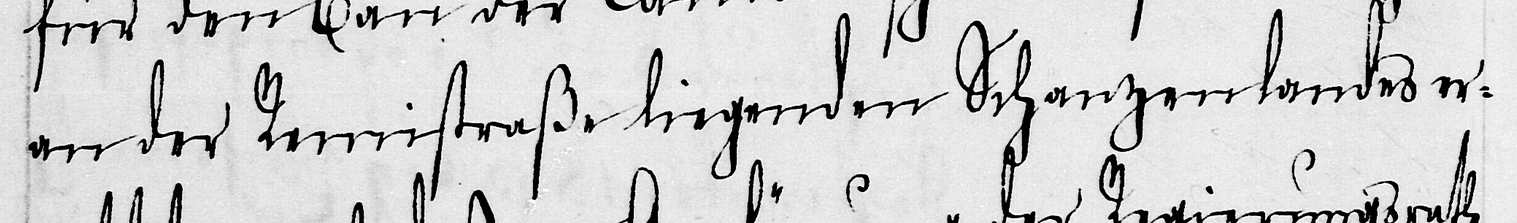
an der Remistraße liegenden Schanzenlandes er¬
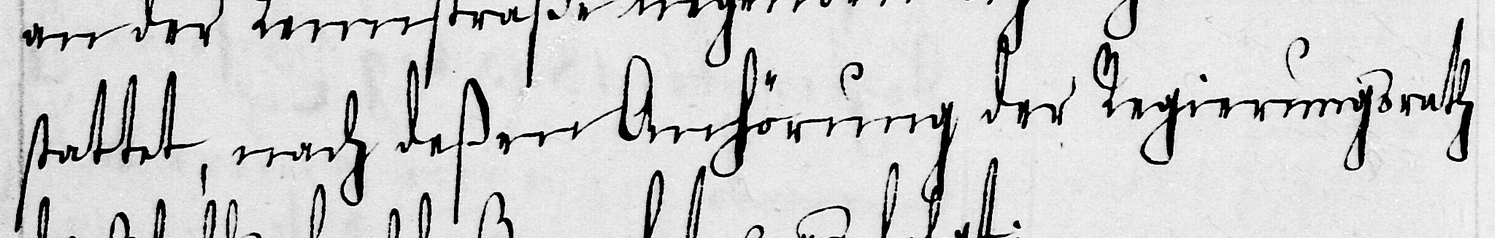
stattet, nach deßen Anhörung der Regierungsrath
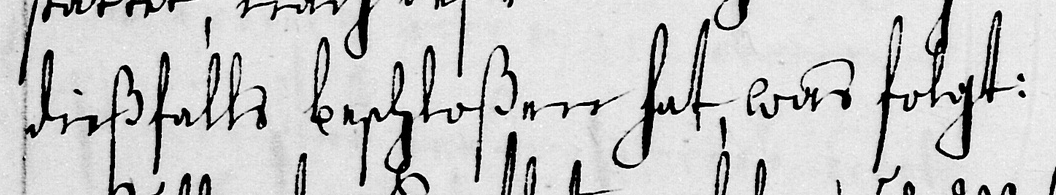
dießfalls beschloßen hat, was folgt:
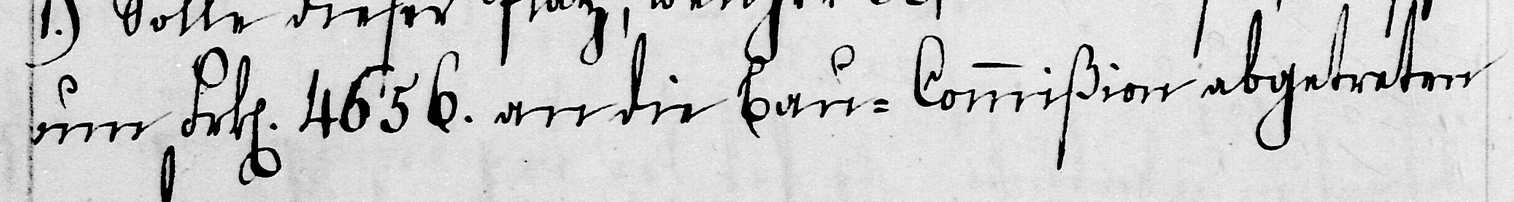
um Frk[en]. 4656. an die Bau-Commißion abgetreten
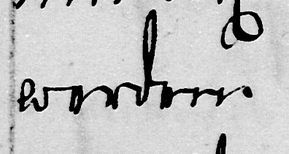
werden.
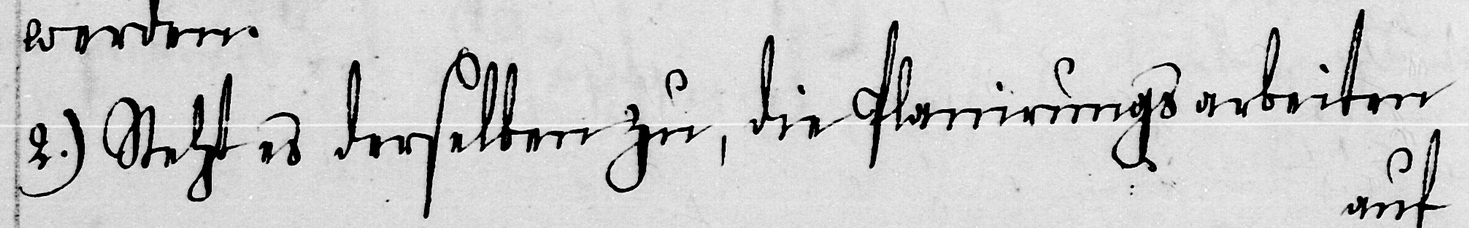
2.) Steht es derselben zu, die Planirungsarbeiten
